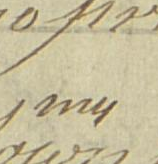my
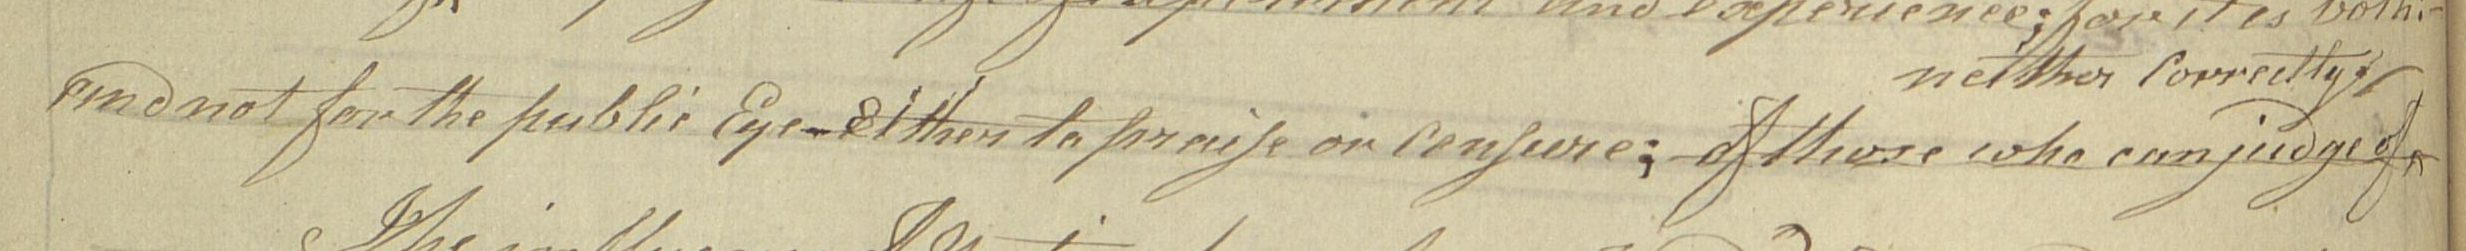and not for the public Eye, either to praise or censure: of those who can judge of ^
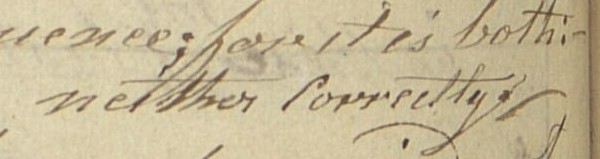neither Correctly
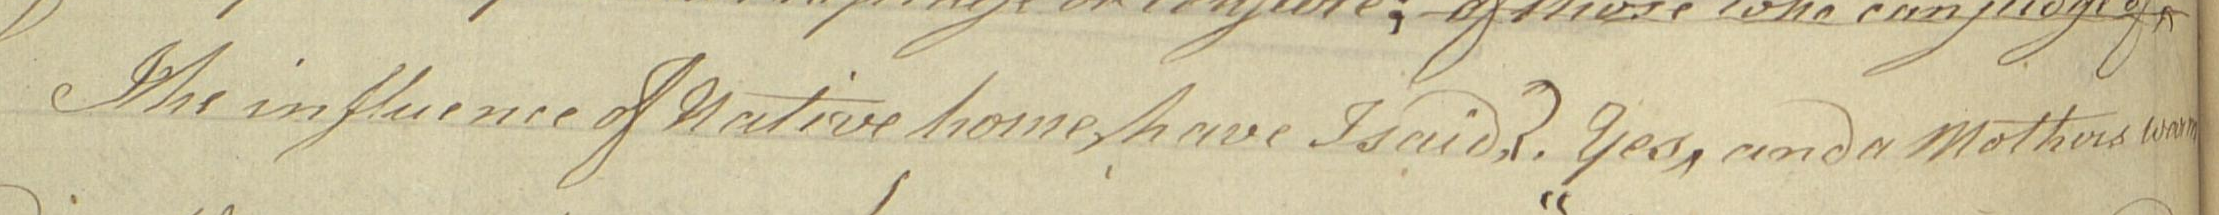The influence of Native home, have I said?" Yes, and a Mothers wa-
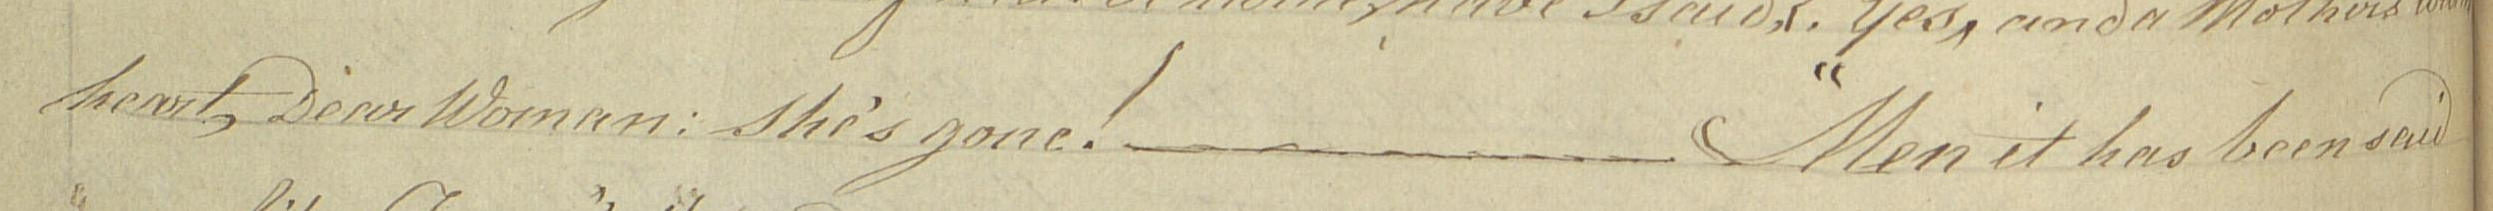heart, Dear Woman; she's gone! "Men it has been said
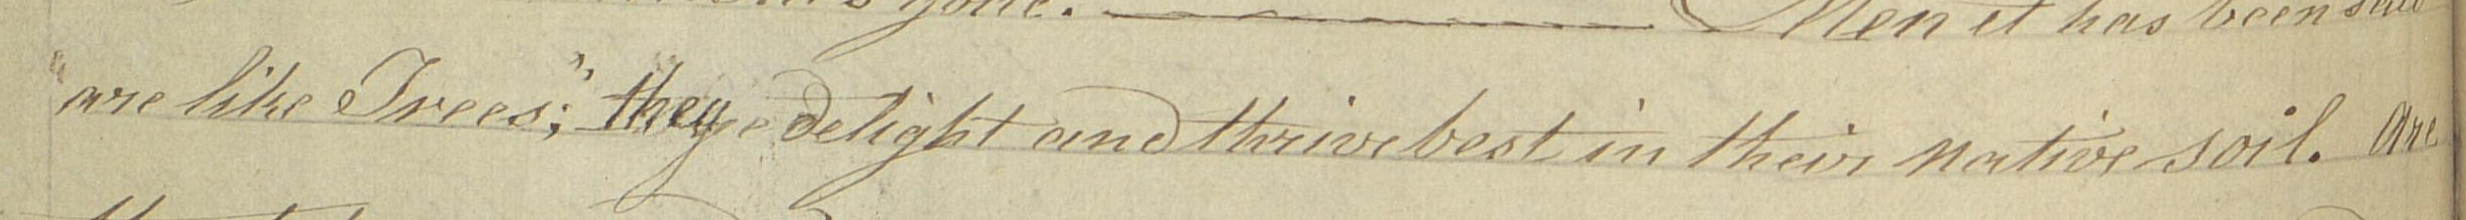"are like Trees;" they delight and thrive best in their native soil. Are
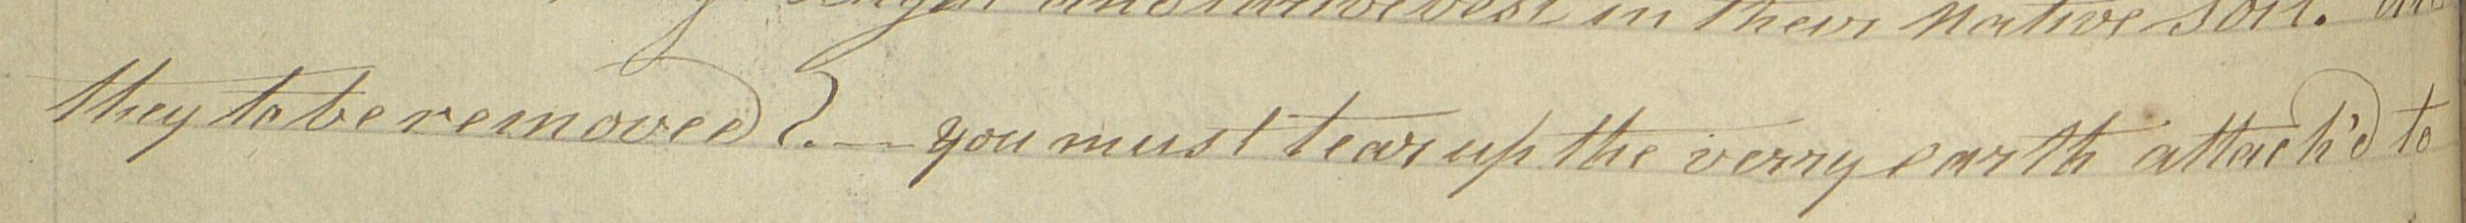they to be removed? you must tear up the verry earth attach'd to
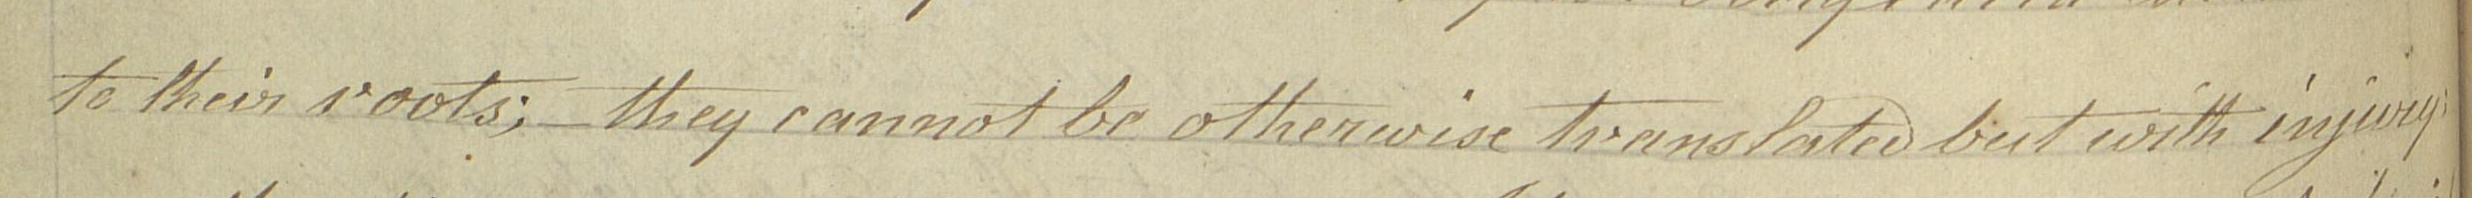to their roots; they cannot be otherwise to translated but with injury
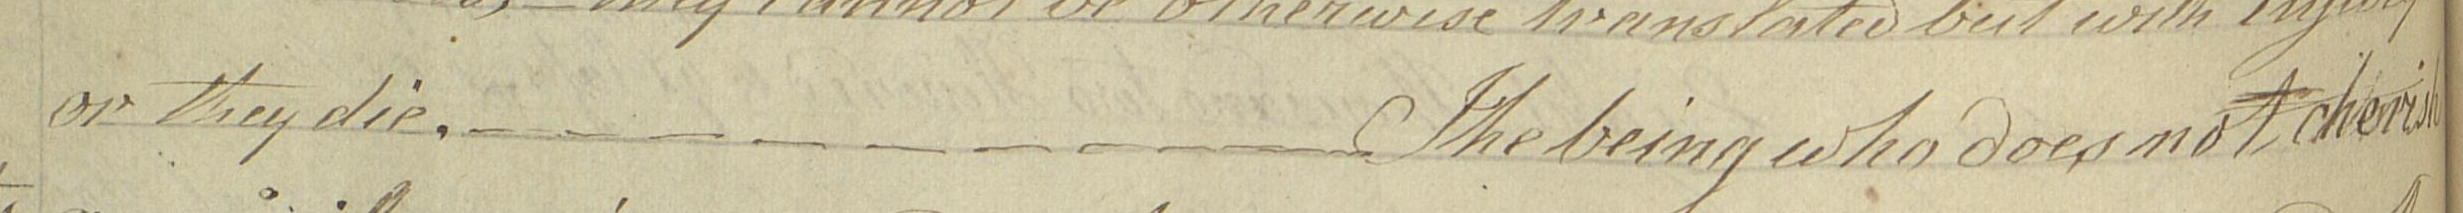or they die, The being who does not cherish
